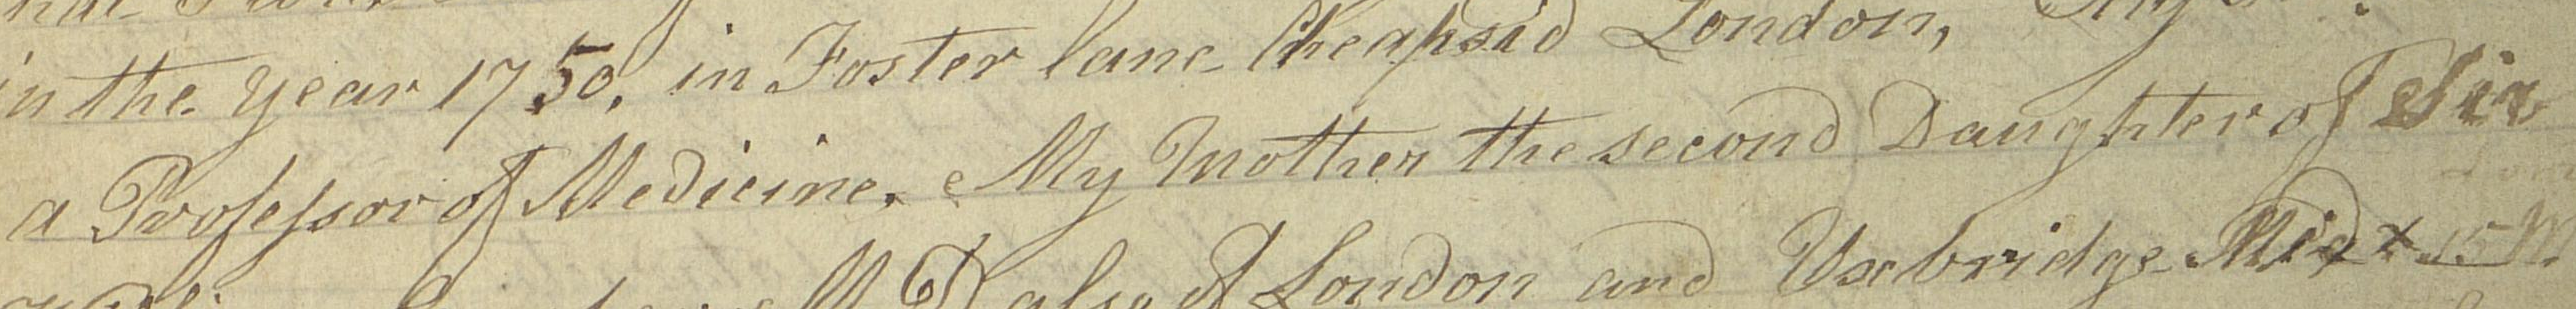a Professor of Medicine, My Mother the second Daughter of Six
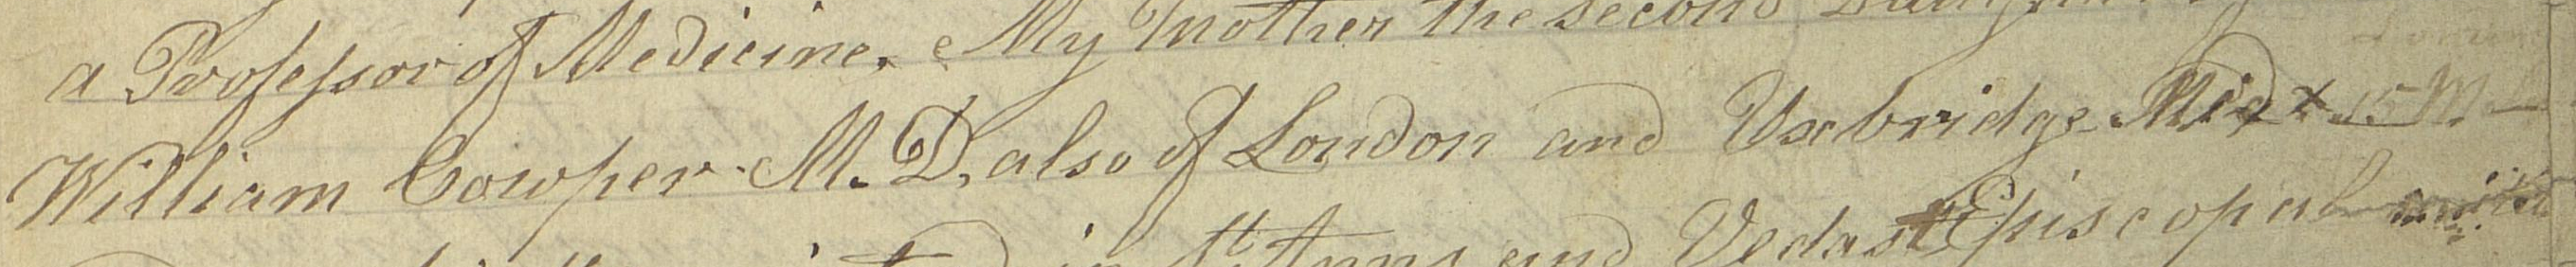William Cowper M. D, also of London and Uxbridge Mixx 15 May
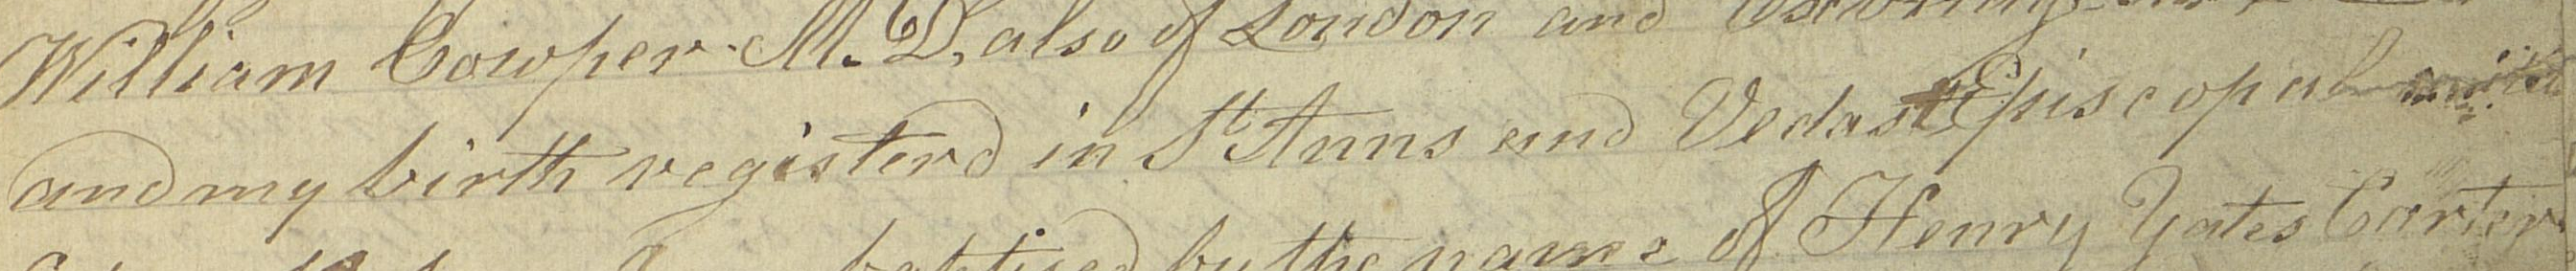and my birth registerd in S^t Anns and Vedas Episcopal with
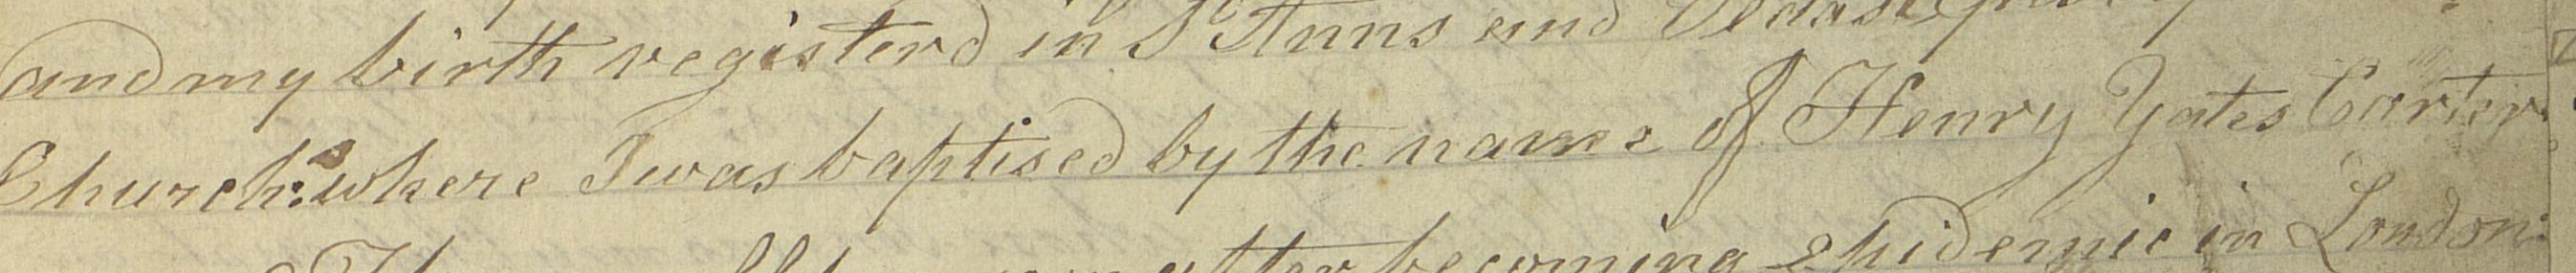Church: where I was baptised by the name of Henry Yates Carter
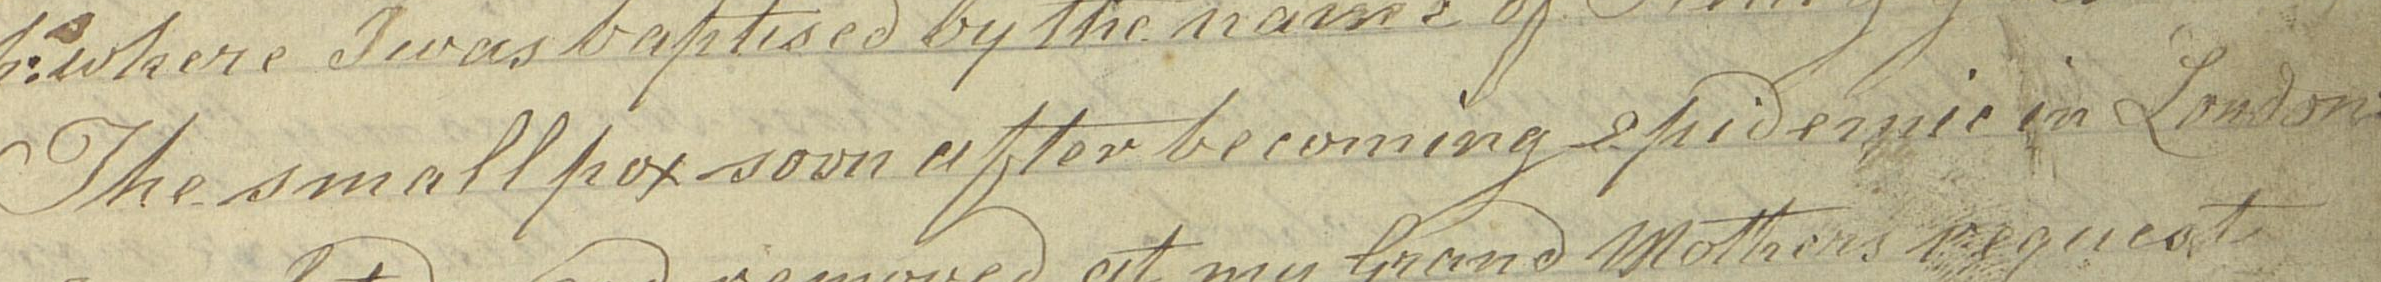The small pox soon after becoming epidemic in London:
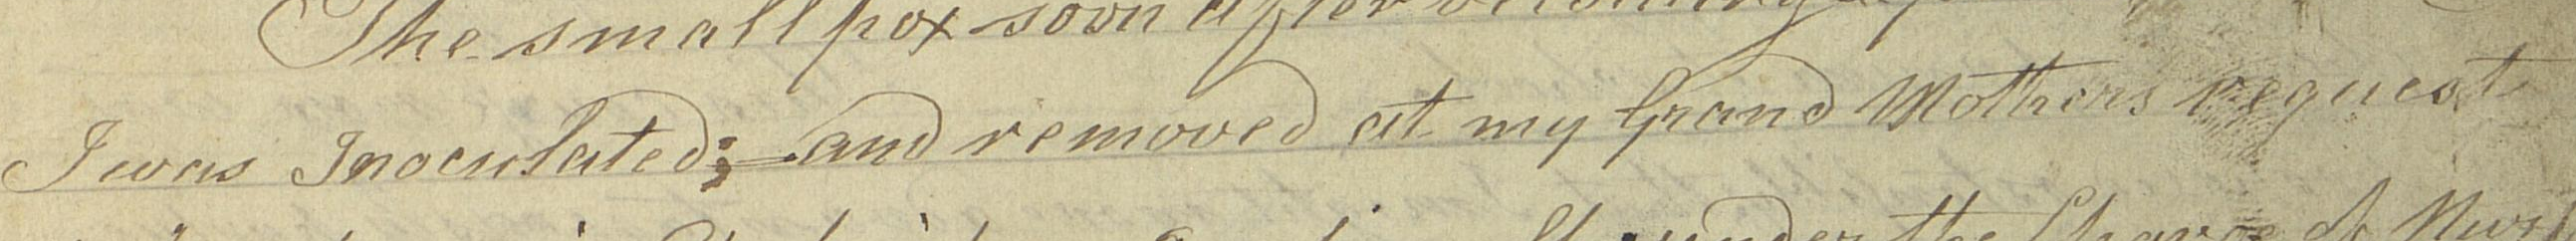I was Inoculated; and removed at my Grand Mother's request
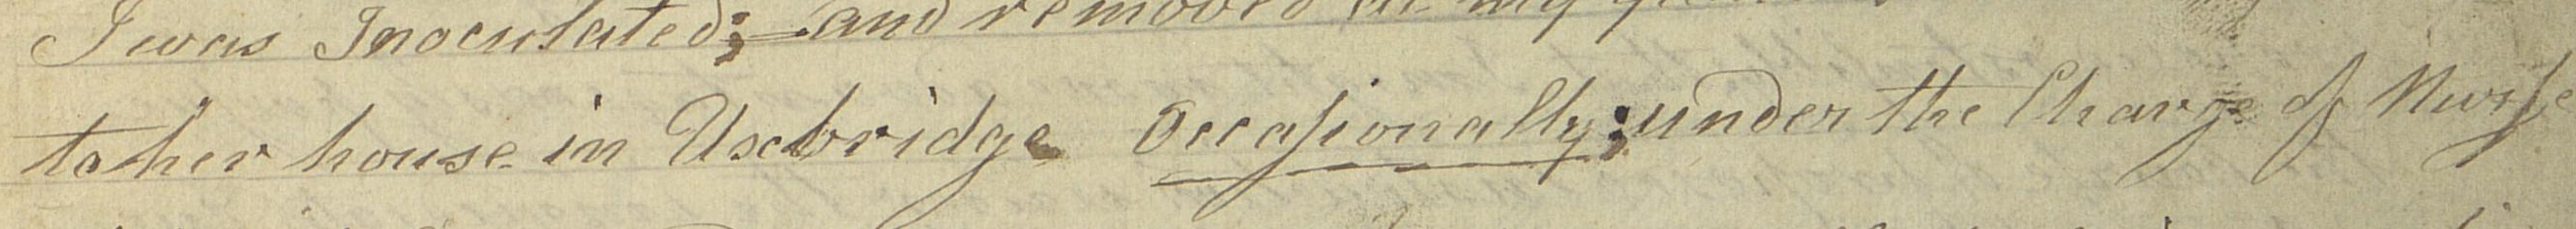to her house in Uxbridge Occasionally; under the Charge of Nurse
